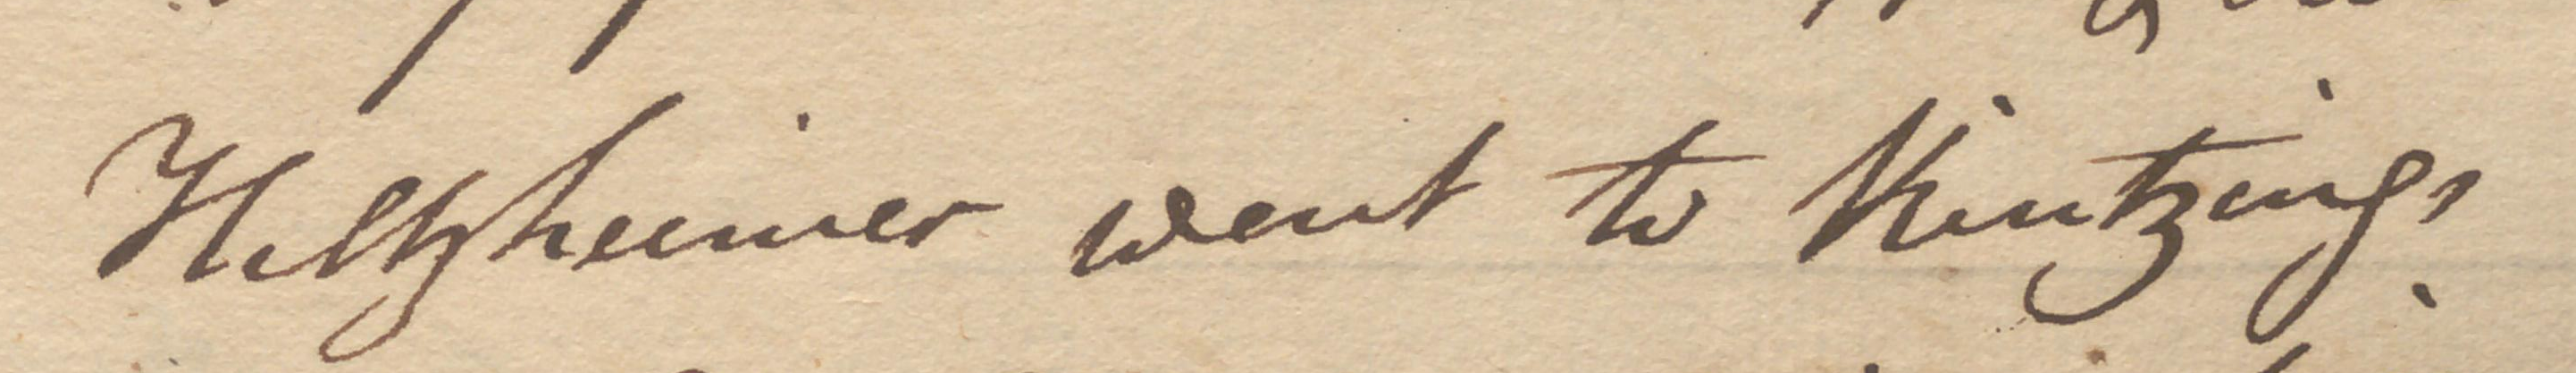Hiltzheimer went to Kintzings
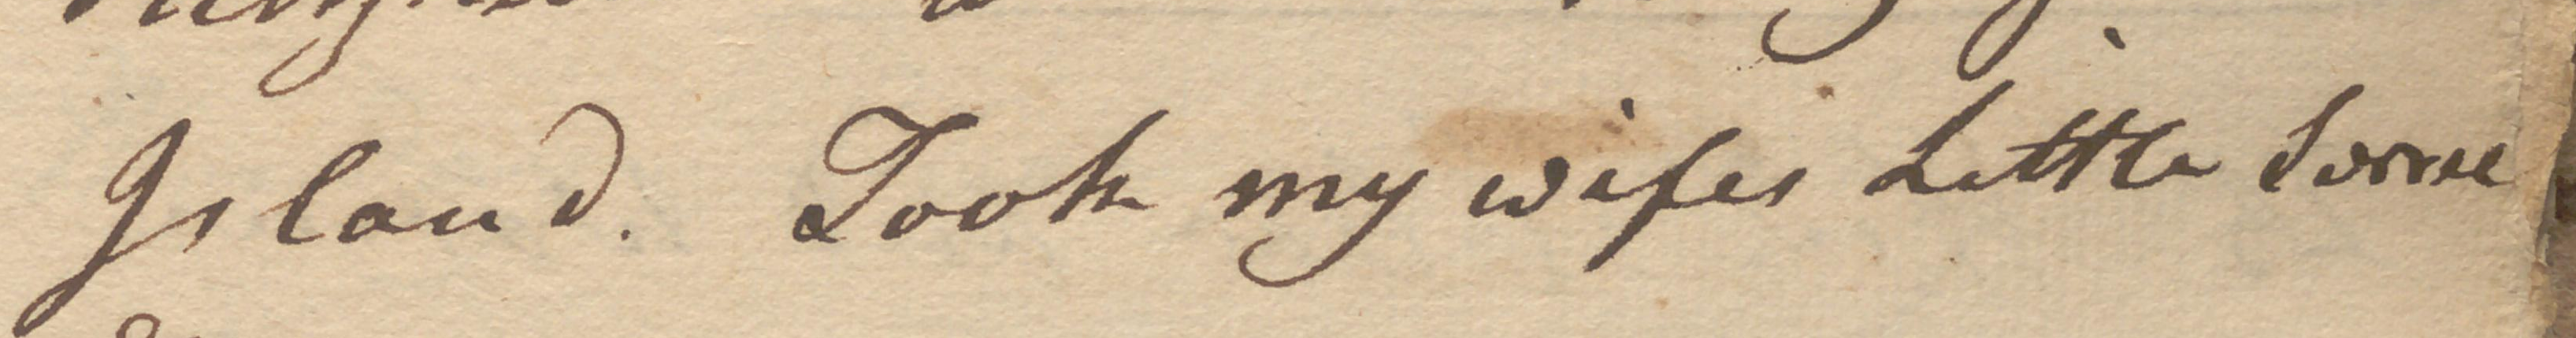Island. Took my wifes Little sorrel
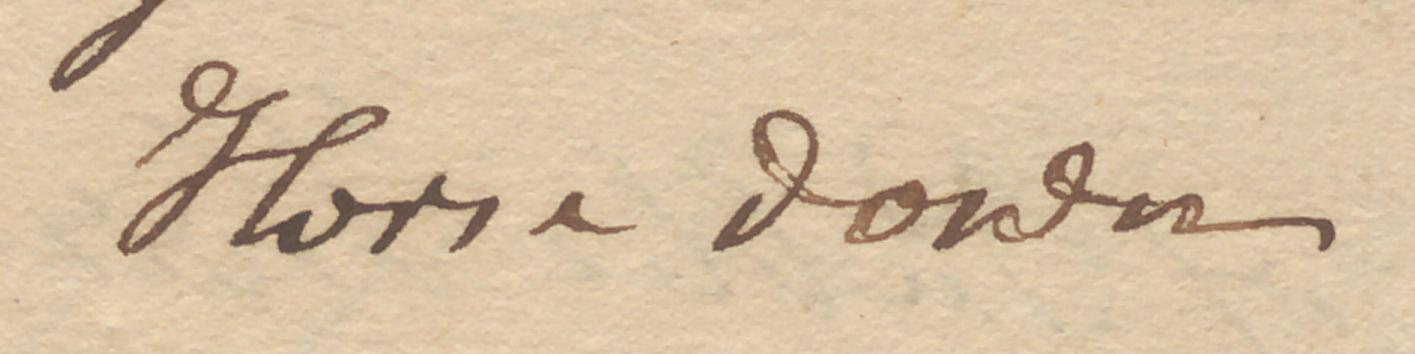Horse down
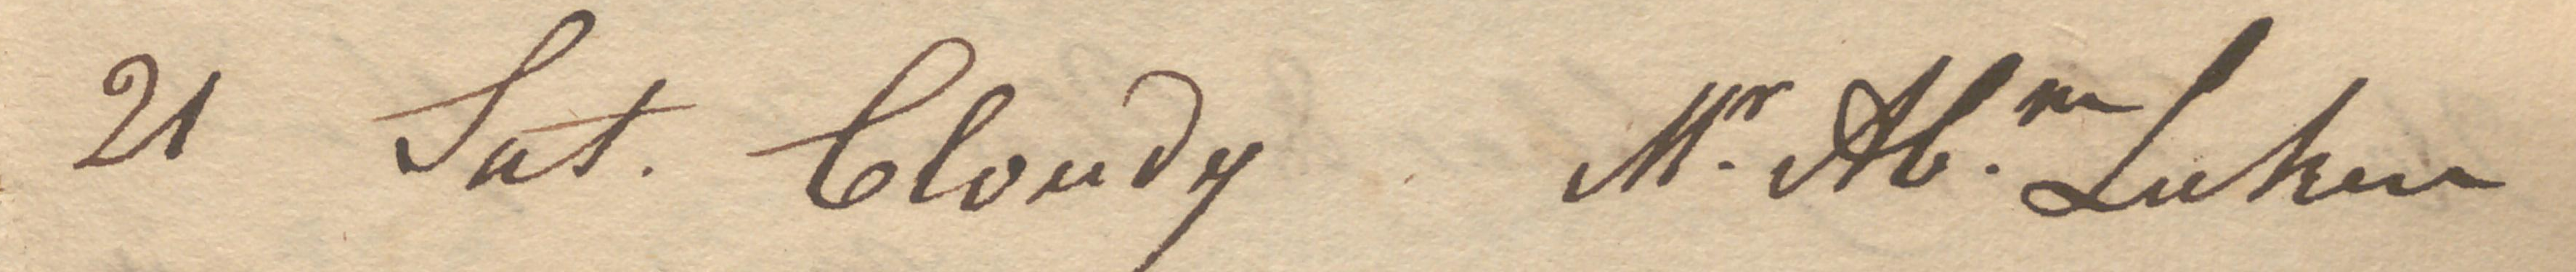21 Sat. Cloudy M^r. Ab^m. Luken
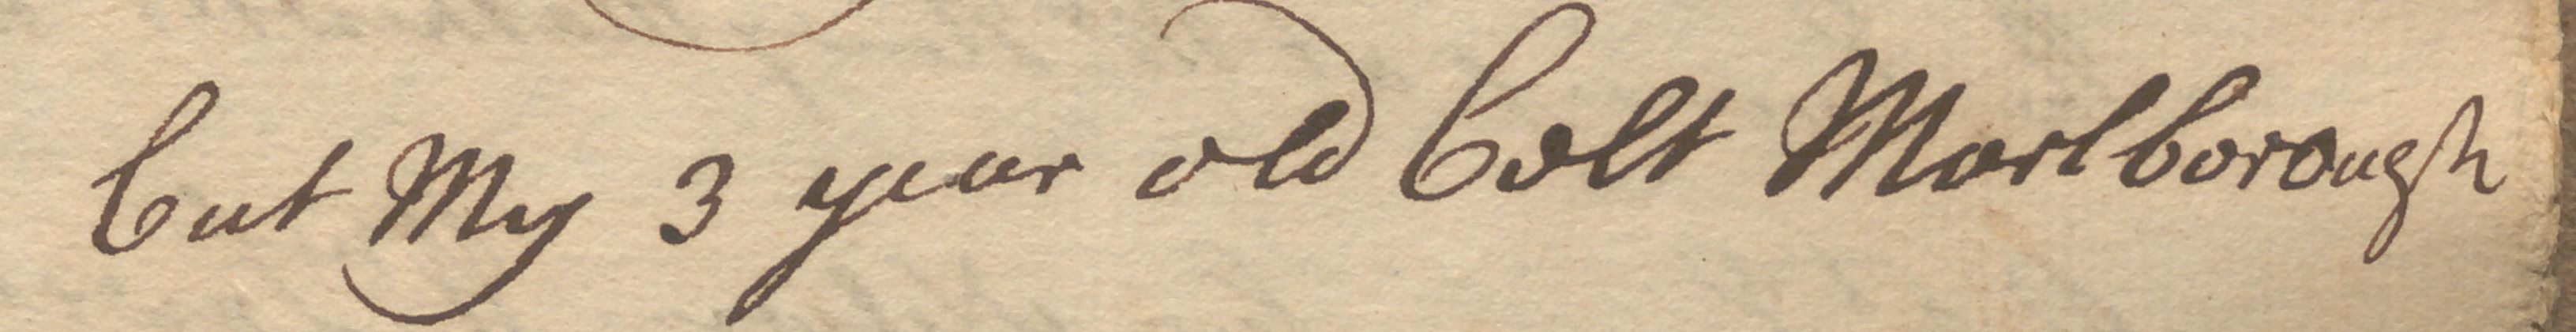Cut My 3 year old Colt Marlborough
